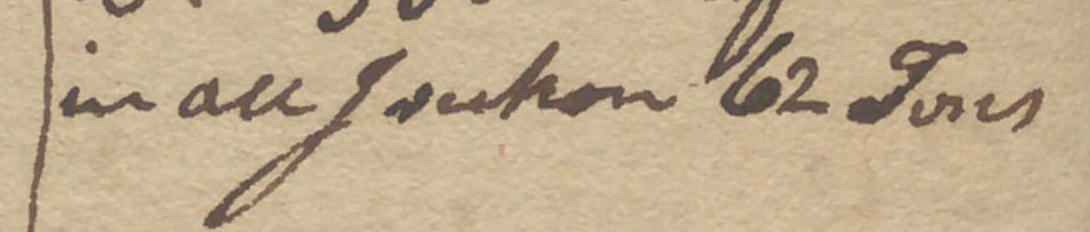in all I reckon 62 Tons
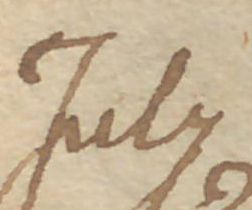July
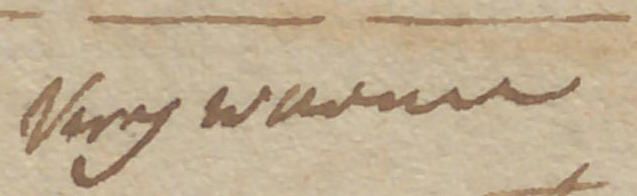Very warme
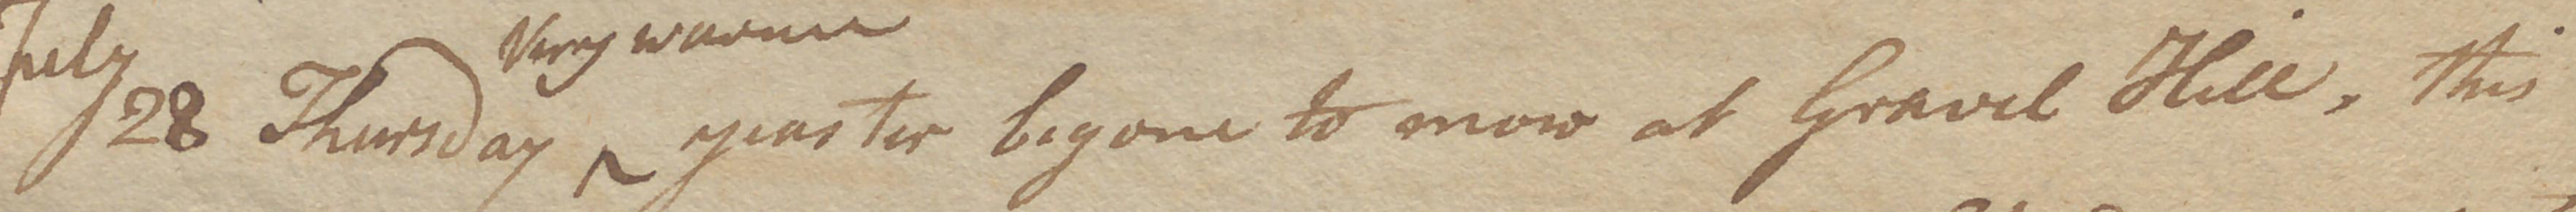28 Thursday ^ yeaster begone to mow at Gravel Hill, this
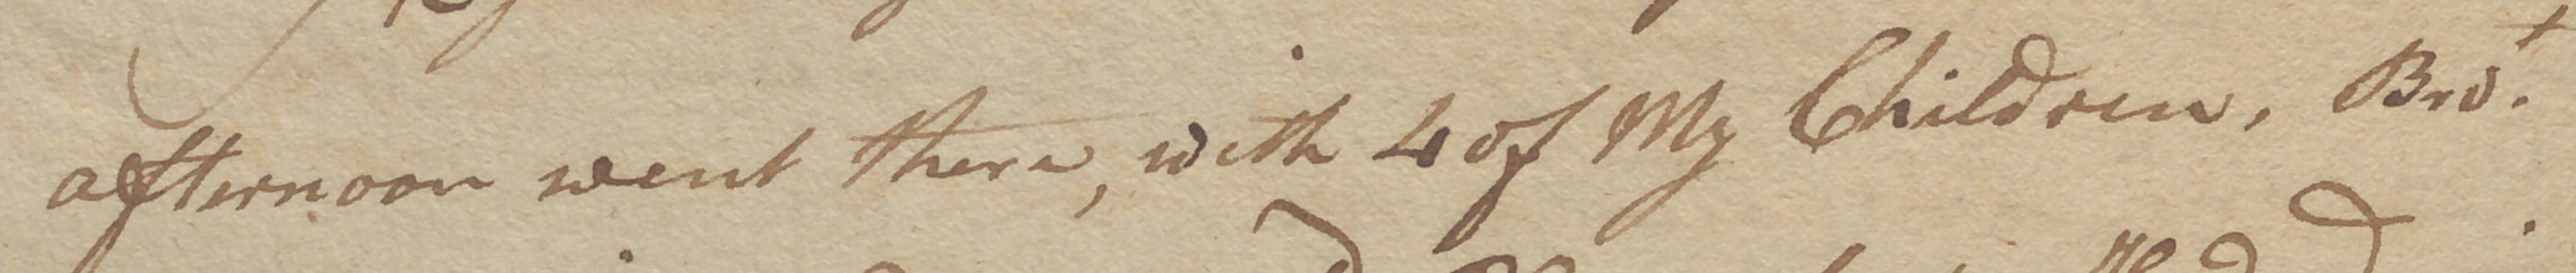afternoon went there with 4 of My Children, Bro^t.
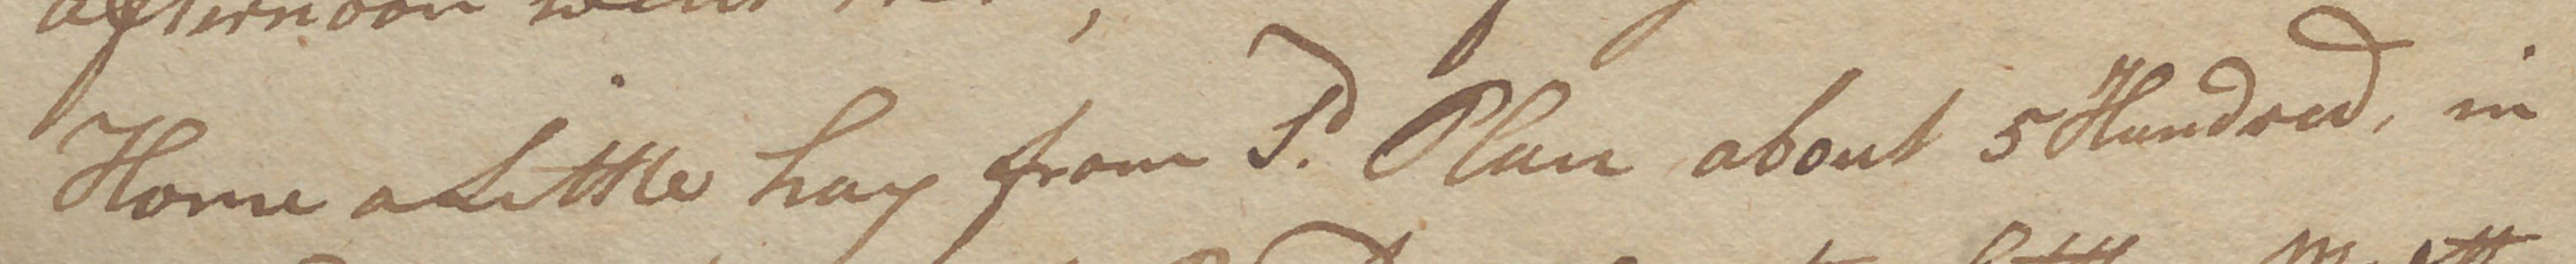Home a Little hay from s^d. Place about 5 Hundred, in
